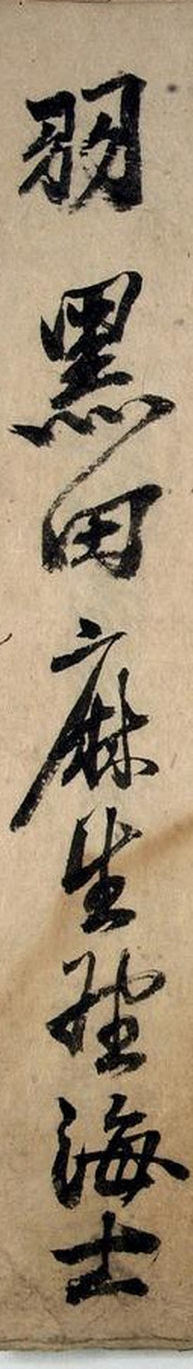羽黒田麻生野海士

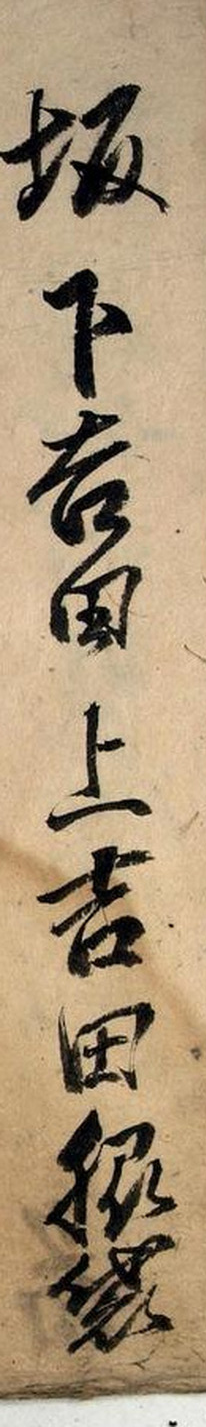坂下吉田上吉田脇袋
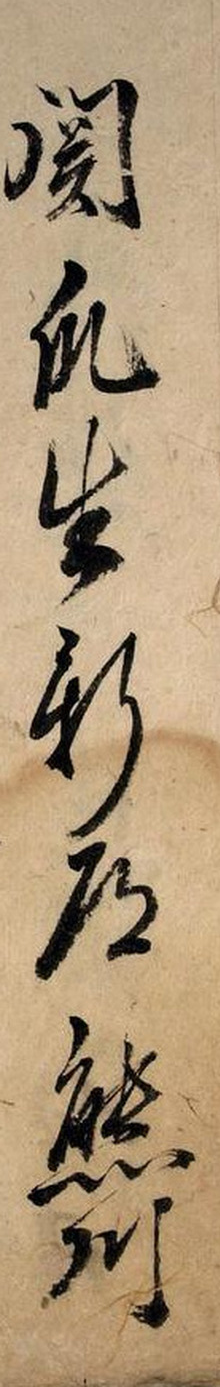関瓜生新道熊川
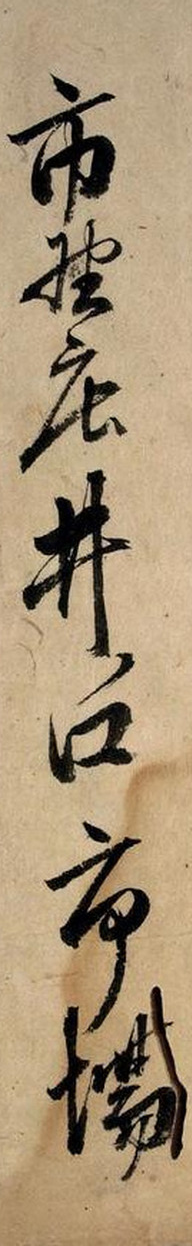市野庄井ノ口市場
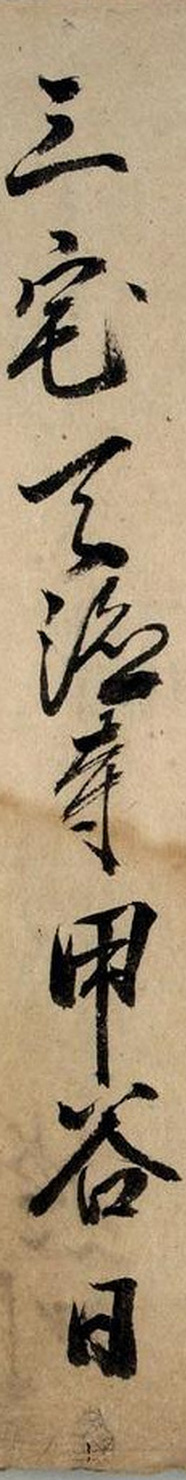三宅天徳寺甲谷日
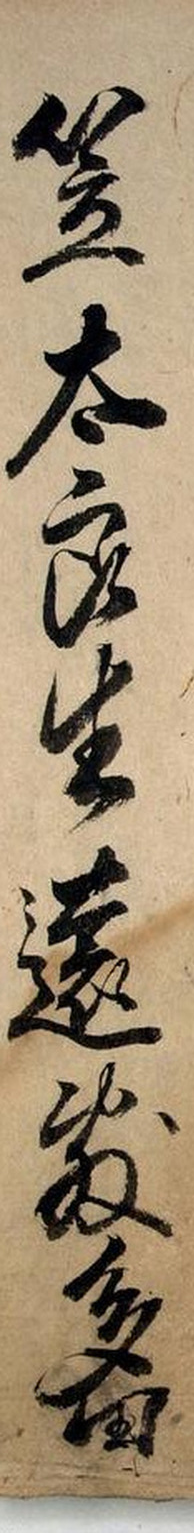笠太良生遠敷多田

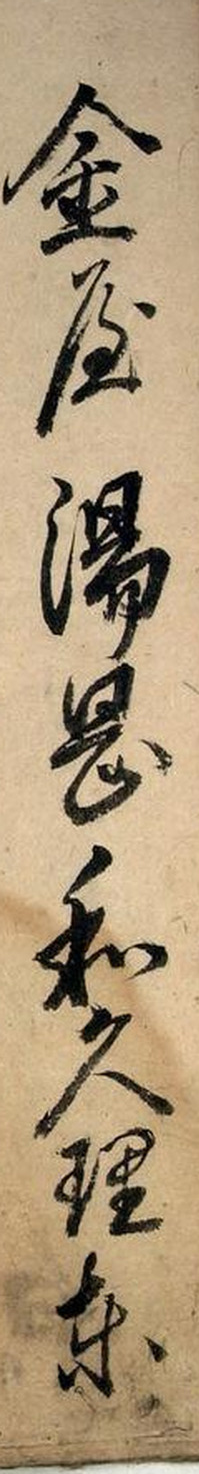金屋湯岡和久理東
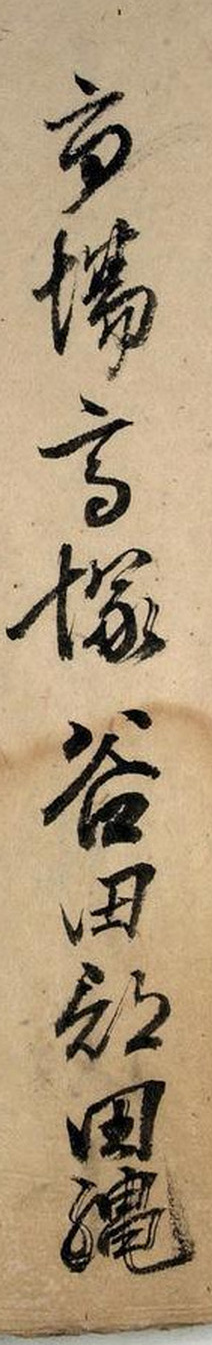市場高塚谷田部田縄
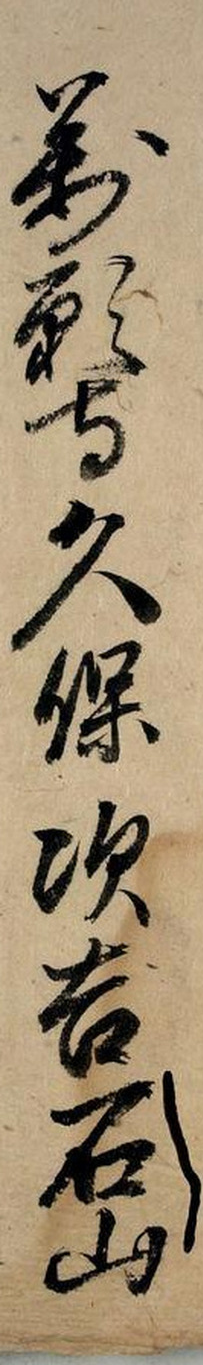万願寺久保次吉石山
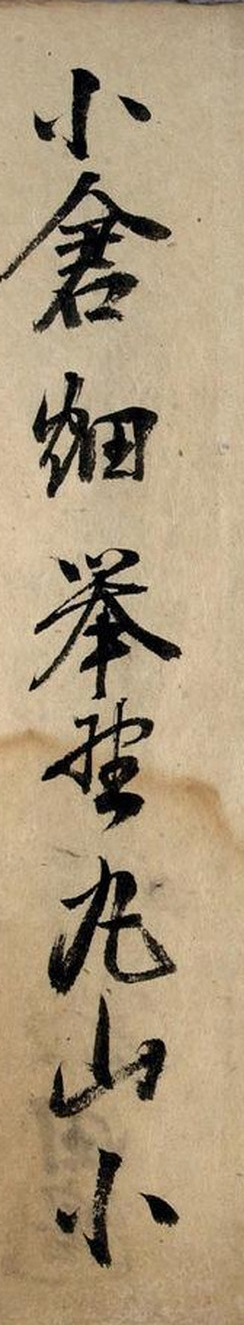小倉畑挙野丸山小
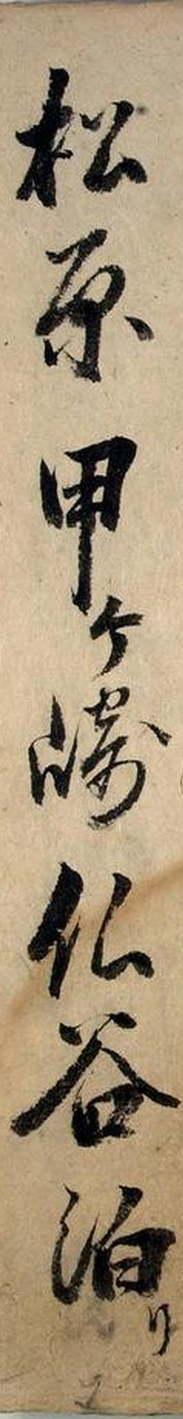松原甲ケ崎仏谷泊リ

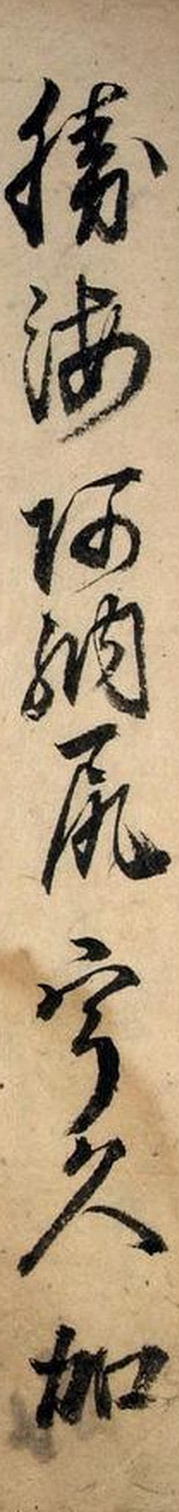勝海阿納尻宇久加
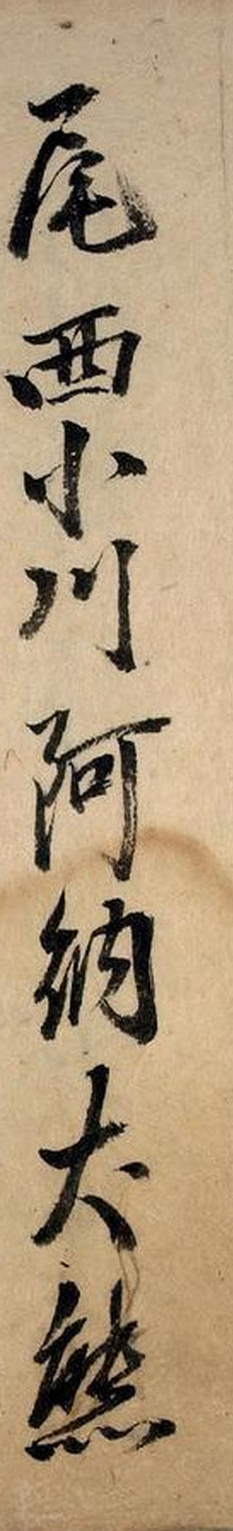尾西小川阿納犬熊
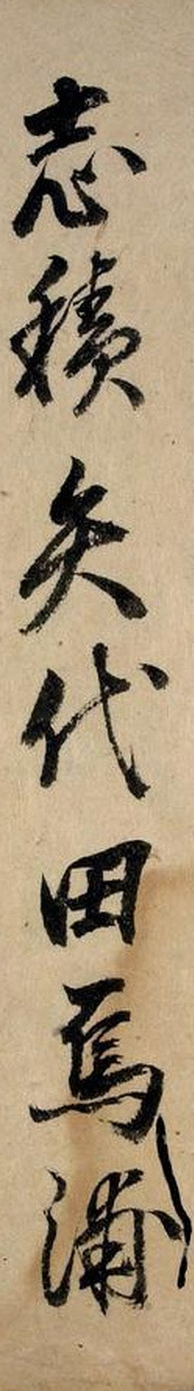志積矢代田烏浦
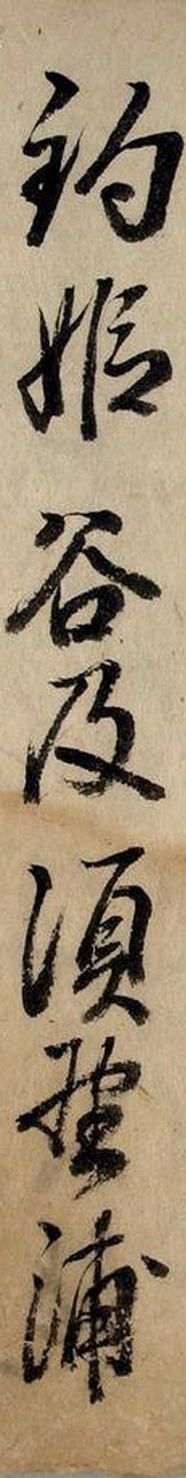釣姫谷及須野浦
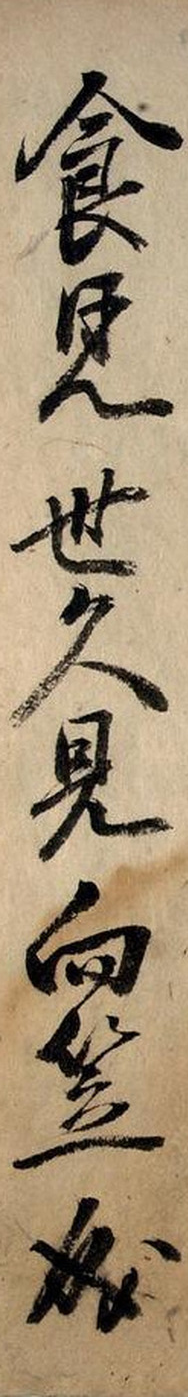食見世久見向笠成
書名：邑名手本（手習）
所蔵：福井県文書館 Fukui Prefectural Archives
